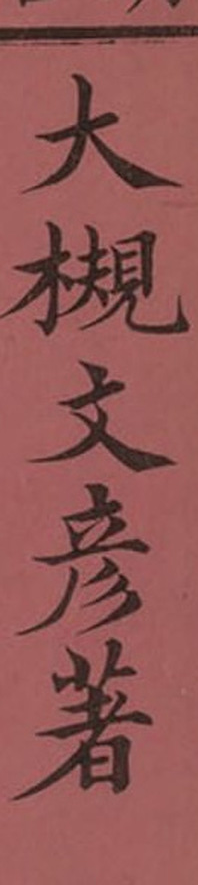大槻文彦著
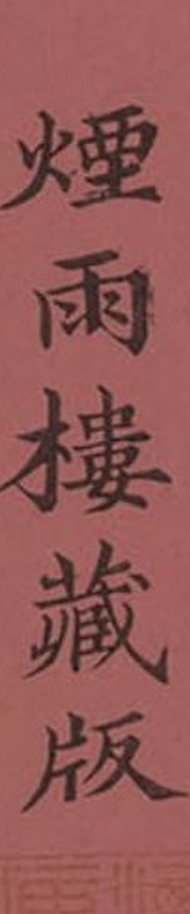煙雨楼蔵版
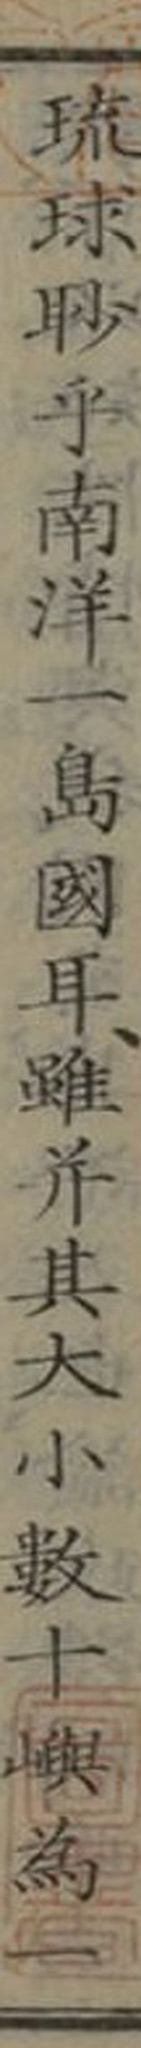琉球眇乎南洋一島国耳、雖幷其大小数十嶼為一
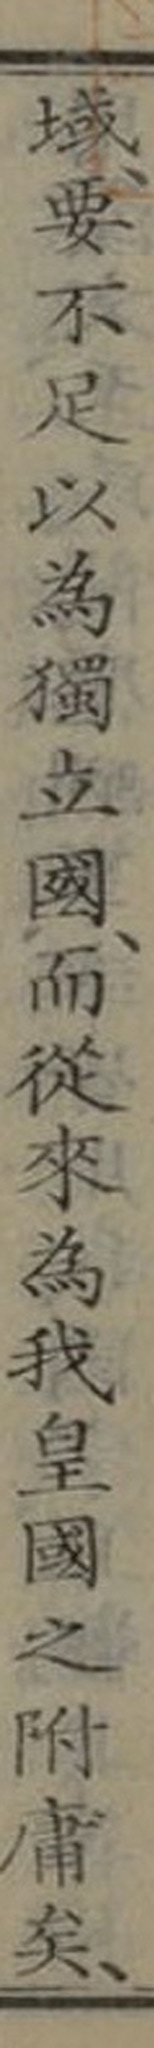域、要不足以為独立国、而従来為我皇国之附庸矣、
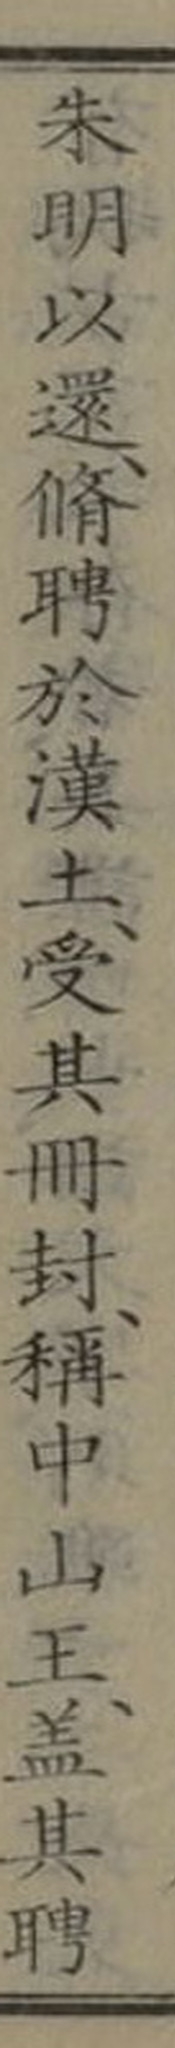朱明以還、脩聘於漢土、受其冊封、称中山王、蓋其聘
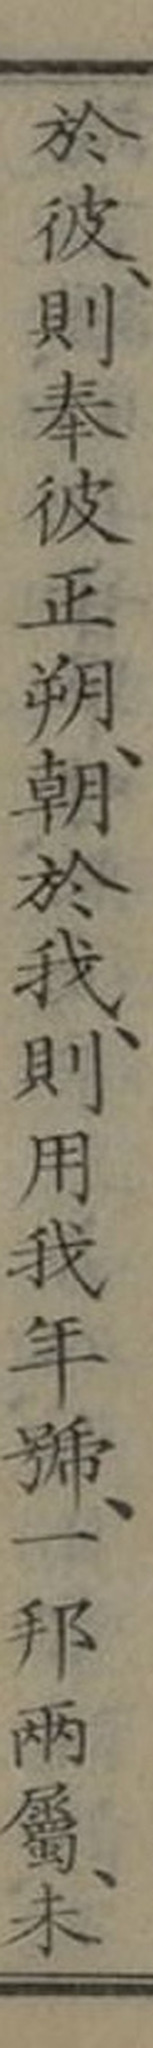於彼、則奉彼正朔、朝於我、則用我年号、一邦両属、未
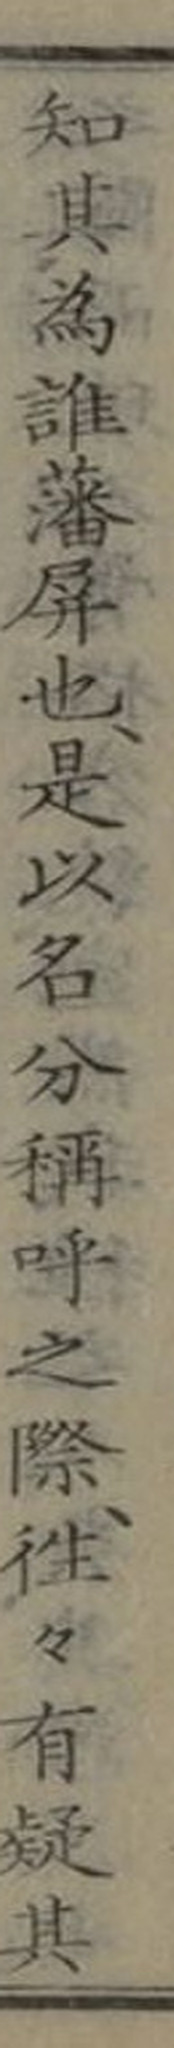知其為誰藩屛也、是以名分称呼之際、往々有疑其
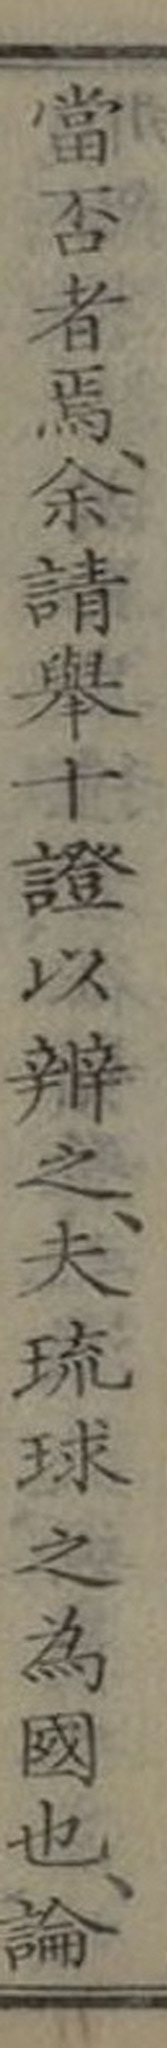当否者焉、余請挙十証以弁之、夫琉球之為国也、論
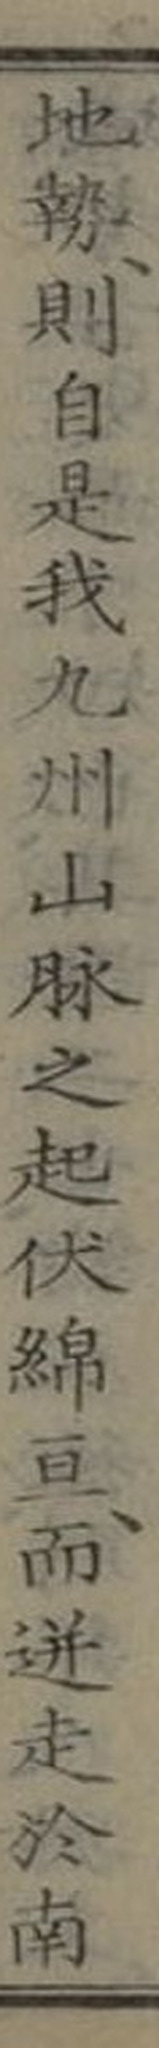地勢、則自是我九州山脈之起伏綿亘、而迸走於南
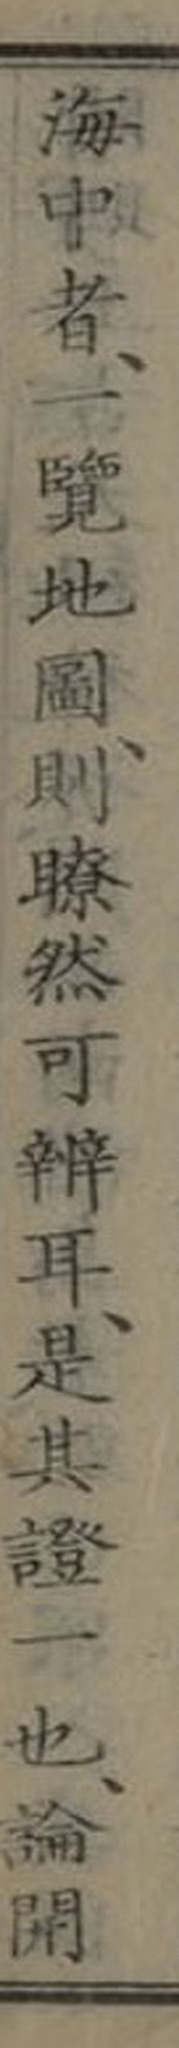海中者、一覧地図、則瞭然可弁耳、其証一也、論開

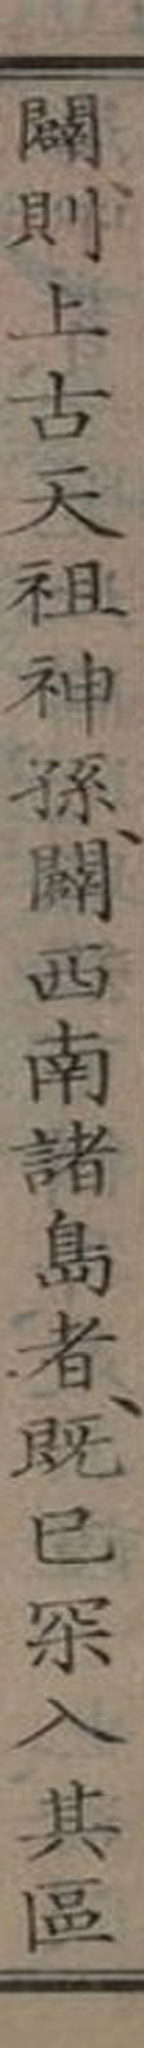闢、則上古天祖神孫、闢西南諸島者、既巳入其区
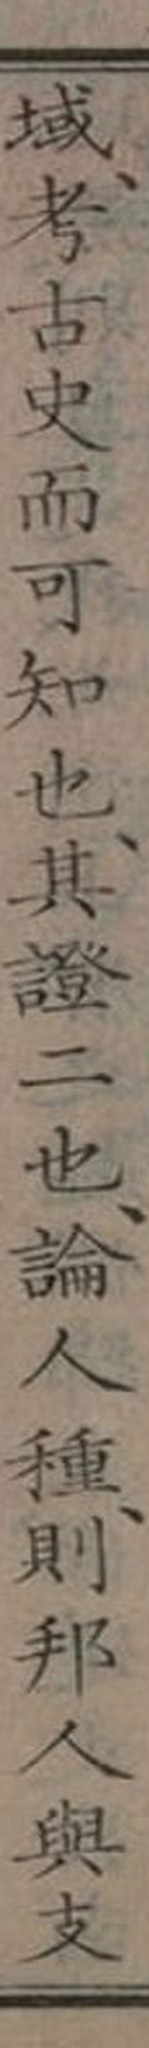域、考古史而可知也、其証二也、論人種、則邦人与支
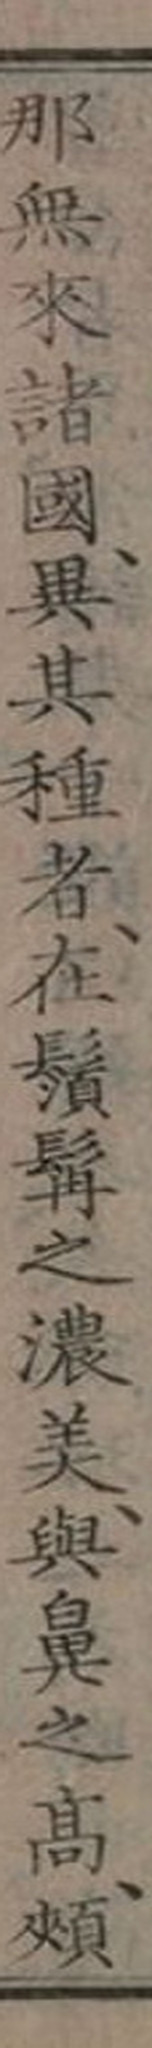那無来諸国、異其種者、在鬚髥之濃美、与鼻之高、頰
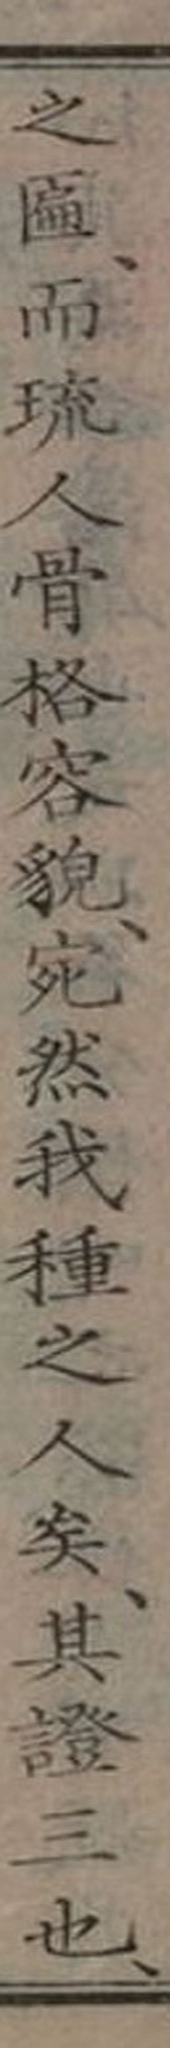之匾、而琉人骨格容貌、宛然我種之人矣、其証三也、
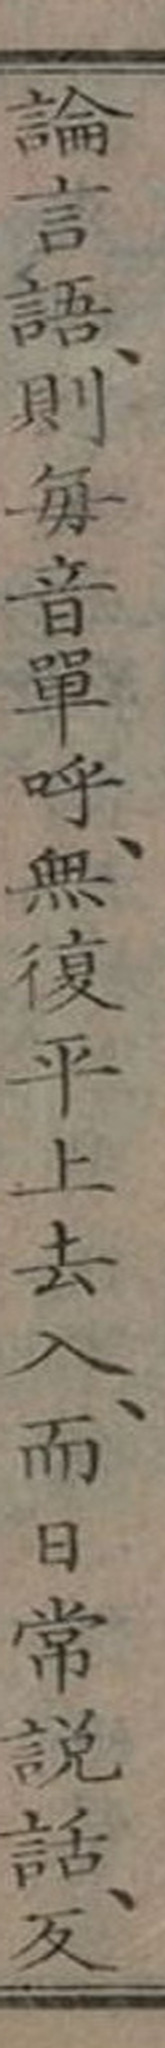論言語、則毎音単呼、無復平上去入、而日常説話、反
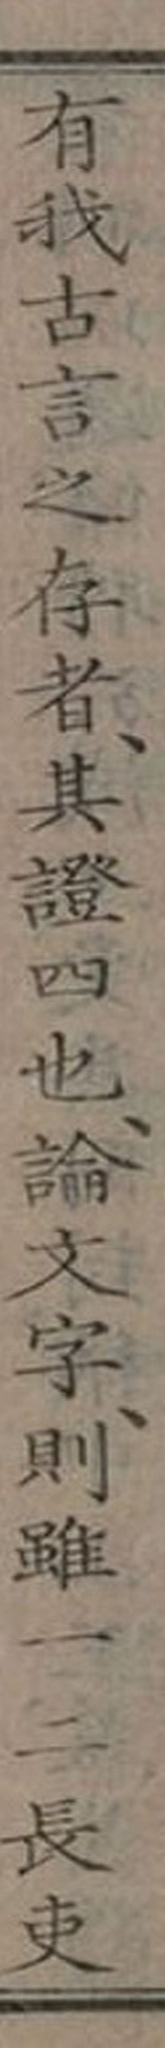有我古言之存者、其証四也、論文字、則雖一二長吏
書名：琉球新誌 図附 上
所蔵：University of the Ryukyus Library
